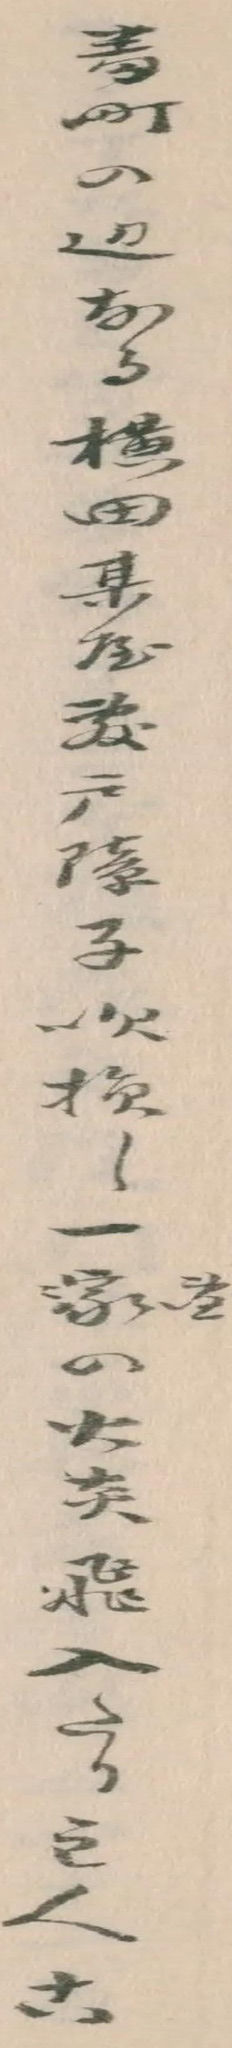番町の辺なる横田某屋敷戸障子吹損し一家の火炎飛入たり主人こ
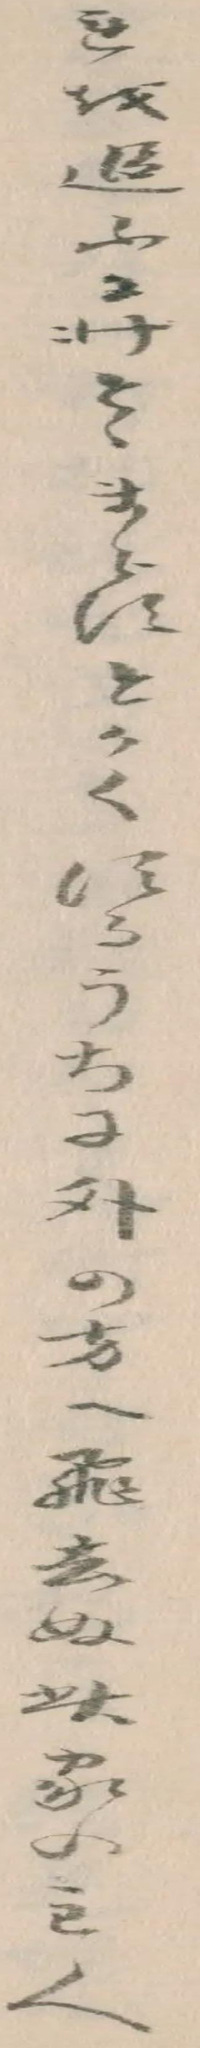れを追ふかけとゝまらすとかくするうちに外の方へ飛去ぬ此家の主人
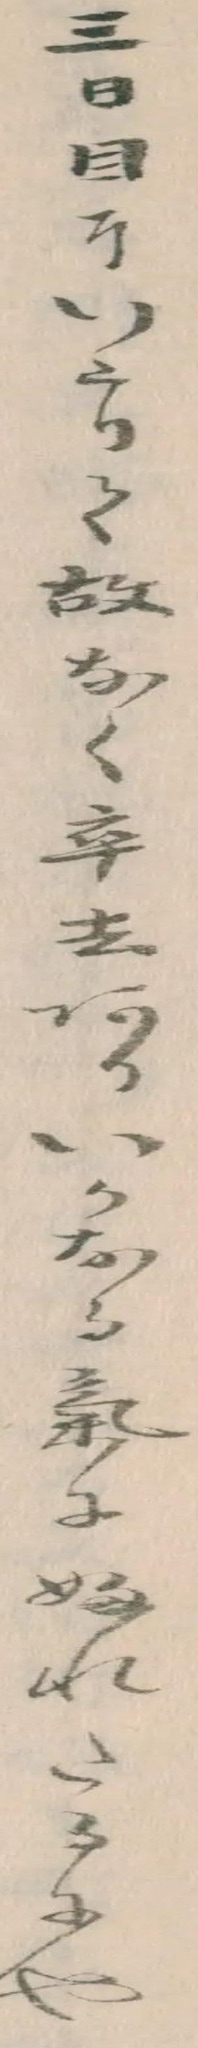三日目にいたりて故なく卒去ありいかなる気にふれたるにや
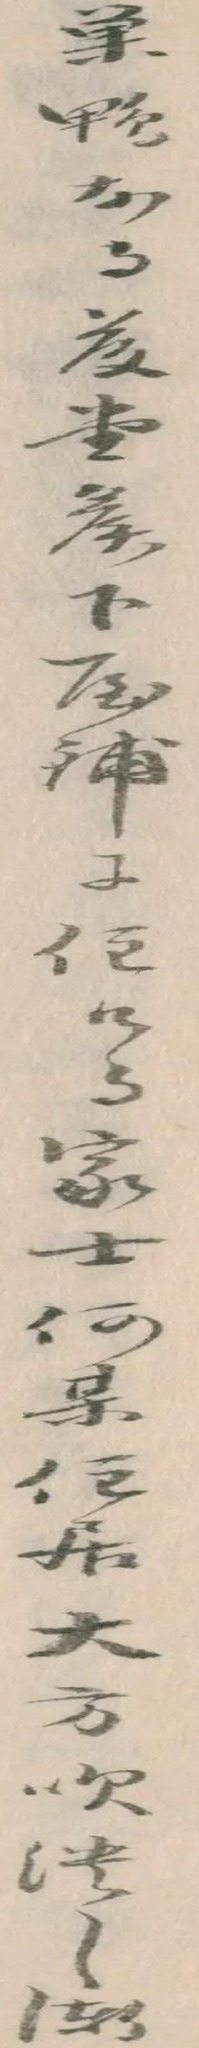巣鴨なる藤堂侯下屋鋪に住ける家士何某住居大方吹潰し漸
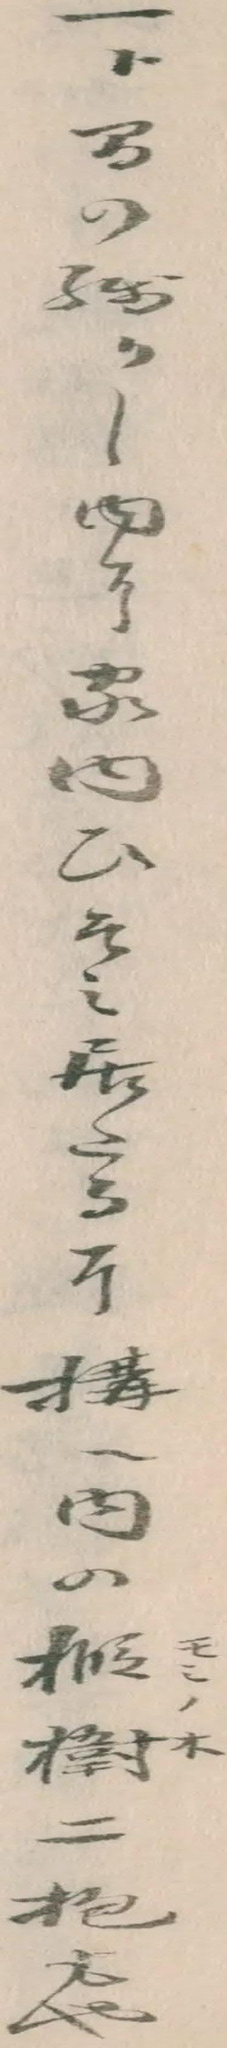一ト間の残りし内に家内ひそみ居たるに構へ内の樅樹二抱もや
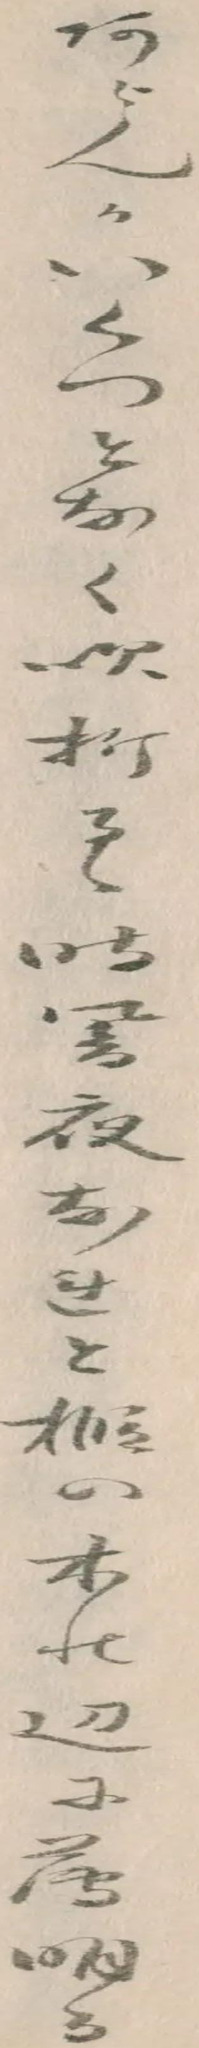あらんかいくつとなく吹折るゝ時闇夜なれと樅の木の辺に薄明る
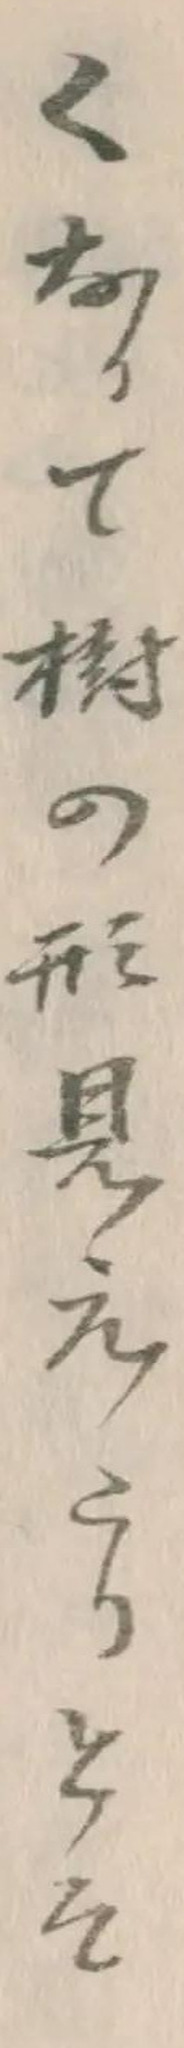くなりて樹の形見えたりとそ
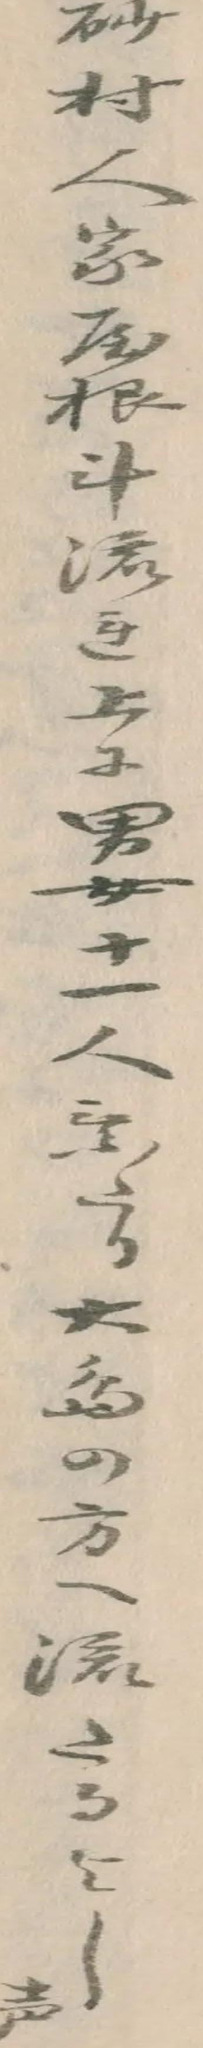砂村人家屋根斗流れ上に男女十一人乗たり大島の方へ流たるよし声

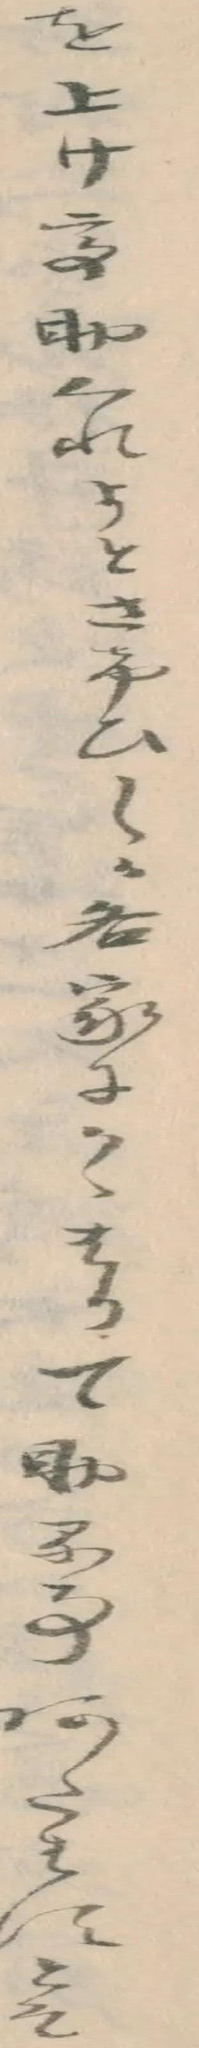を上けて助くれよとさけひしか各家にかゝはりて助る事あたはすとそ
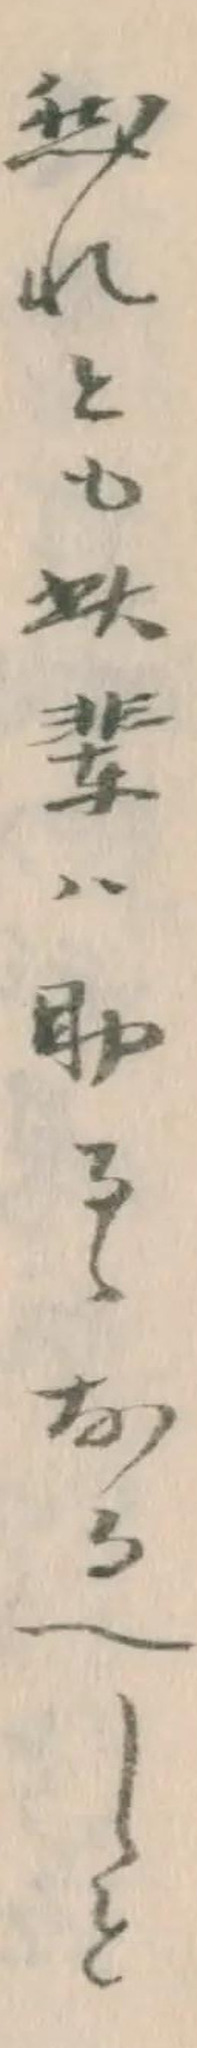然れとも此輩は助るゝなるへしと
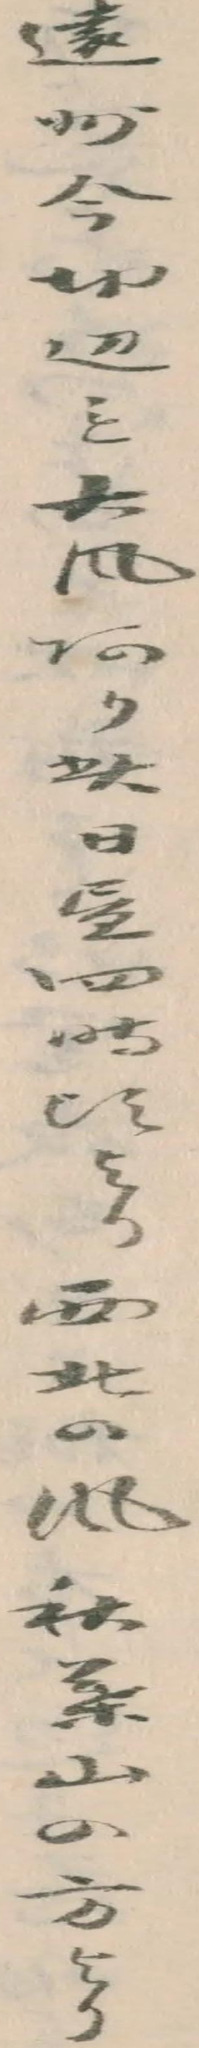遠州今切辺も大風あり此日昼四時頃より西北の風秋葉山の方より
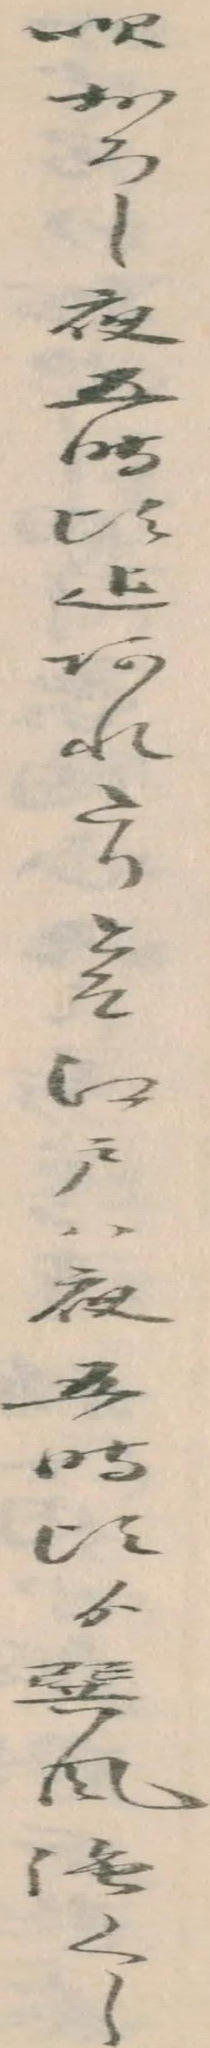吹おろし夜五時頃迄あれたりとそ江戸は夜五時頃ゟ巽風強くし
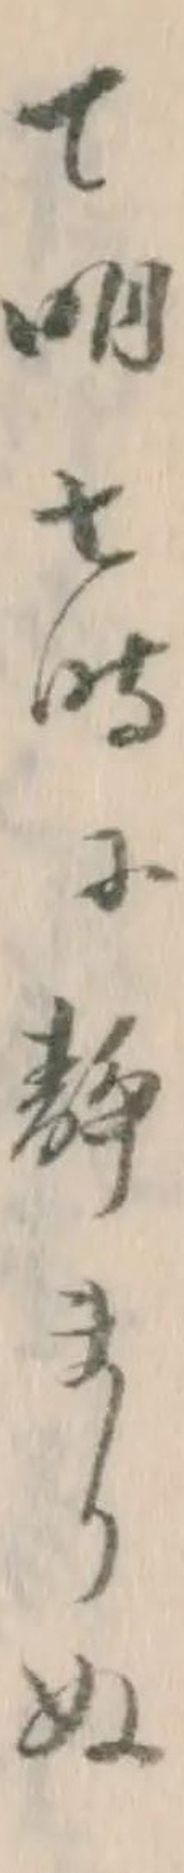て明七時に静まりぬ
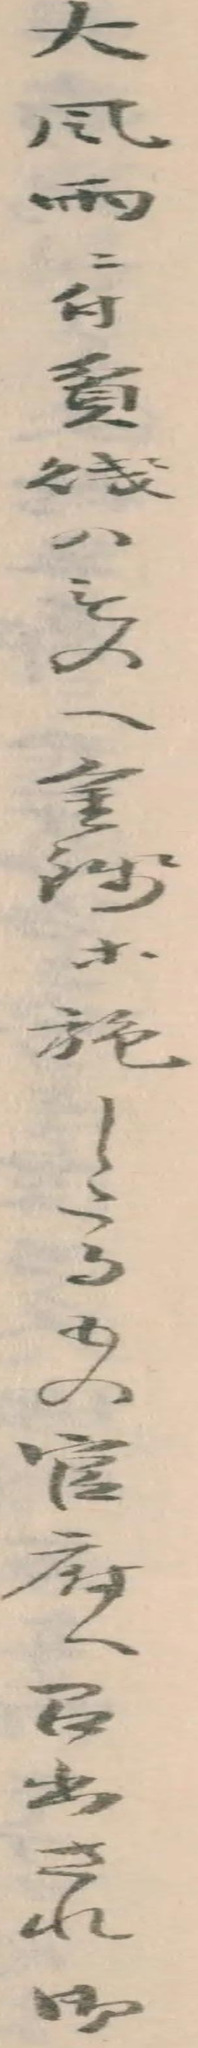大風雨付貧銭のものへ金銭等施したるもの官府へ召出され御
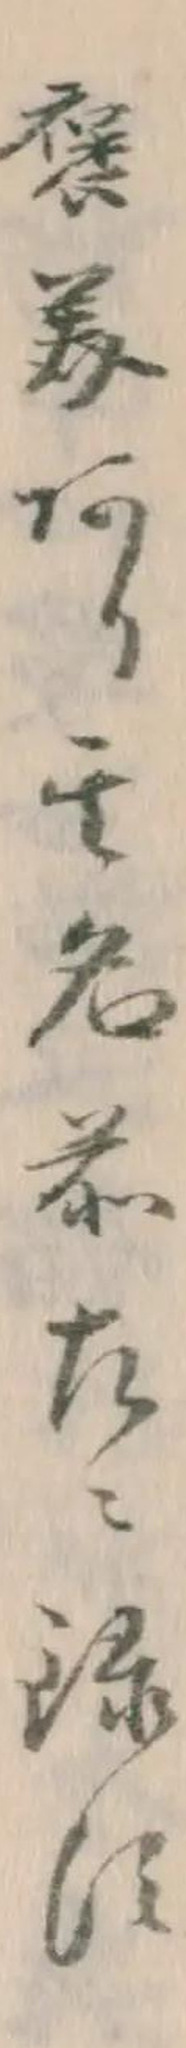褒美あり其名前左に録す
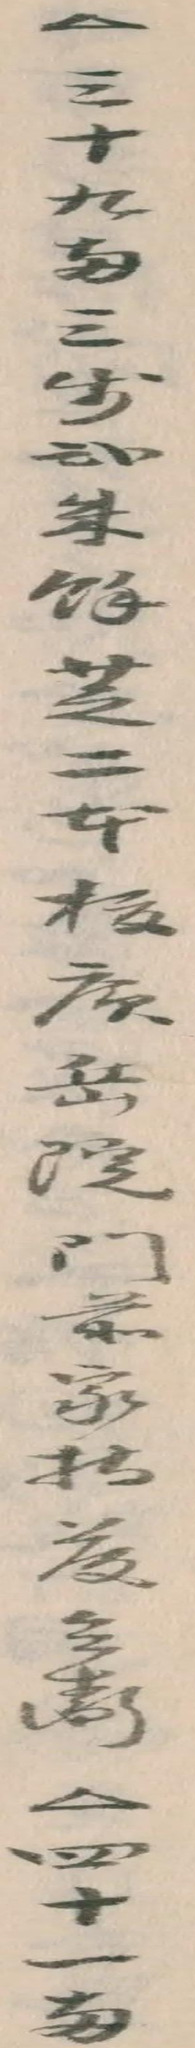△三十九両三歩弐朱余芝二本榎広岳院門前家持藤兵衛△四十一両
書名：地災撮要. 巻10(地震之部) 上,下
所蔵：国立国会図書館 National Diet Library, JAPAN
